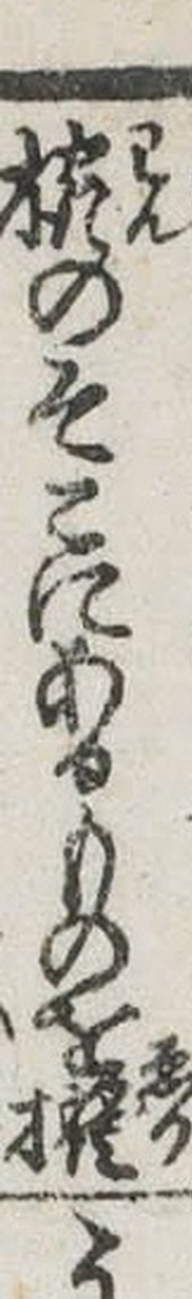椀のそこにあるものを撰
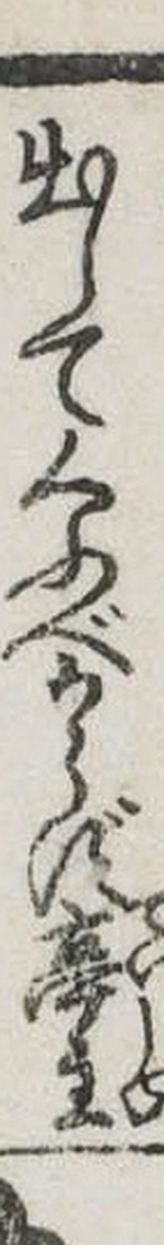出してくふべからず亭主
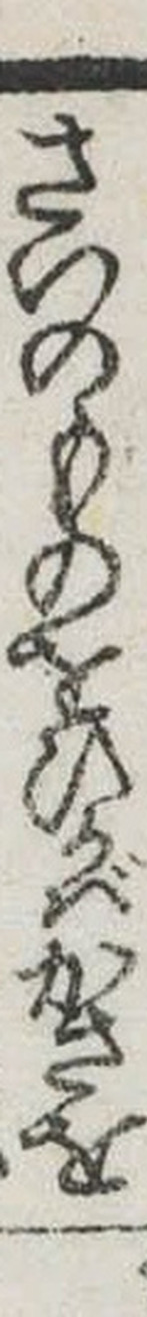さいのものをひかばかさを
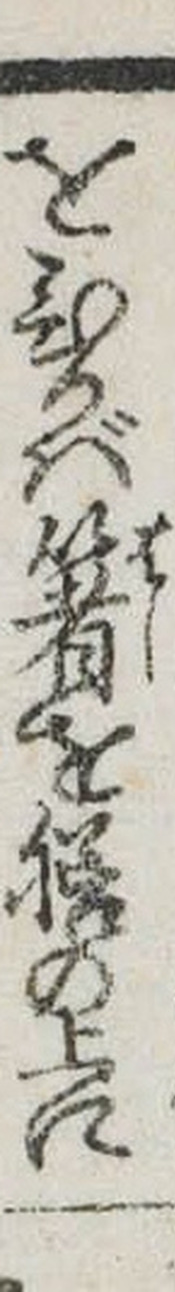をひかば箸を膳の上に
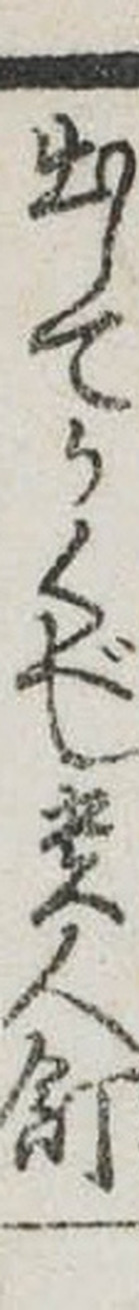出してうくべし貴人飣
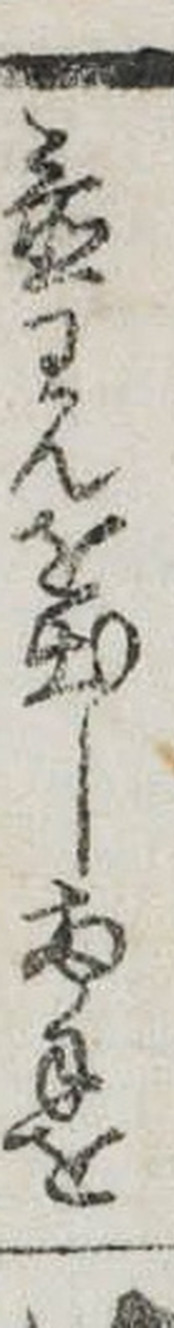置わんを出し両手を
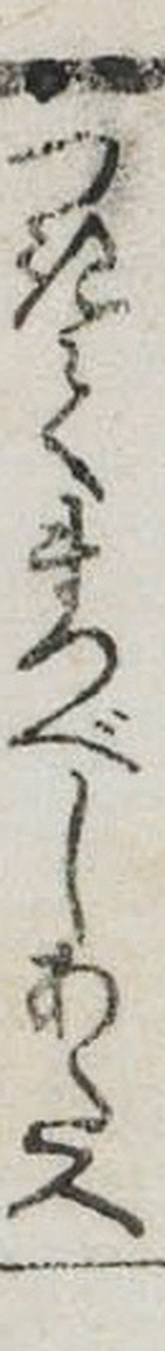つきてまつべしあたへ
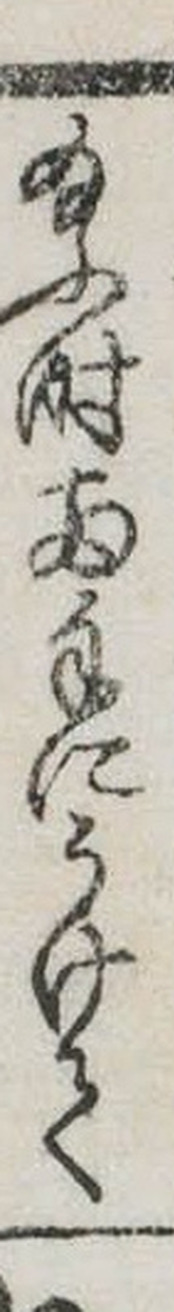給ふ時両手にうけて
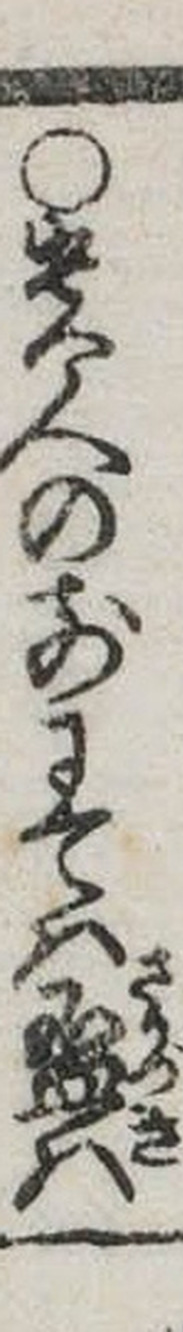○貴人の前にては盃は
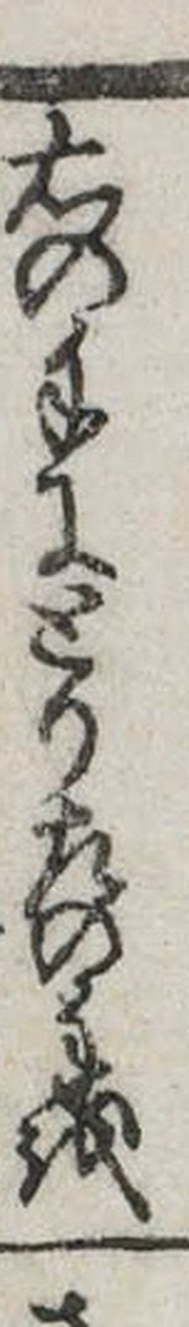右の手にとり左の手を
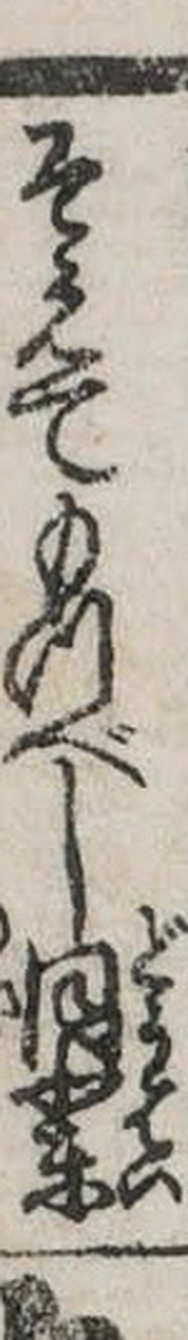そえてもつべし同輩
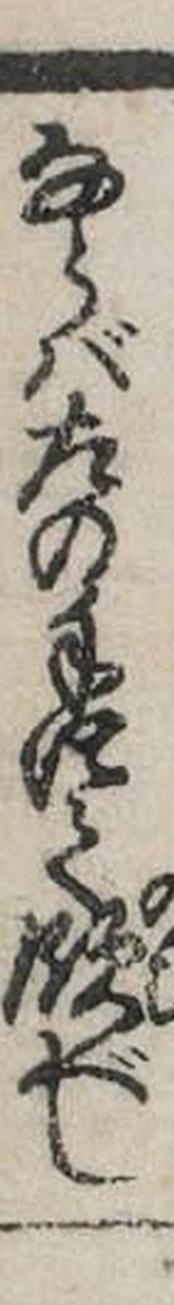ならば左の手にて飲べし
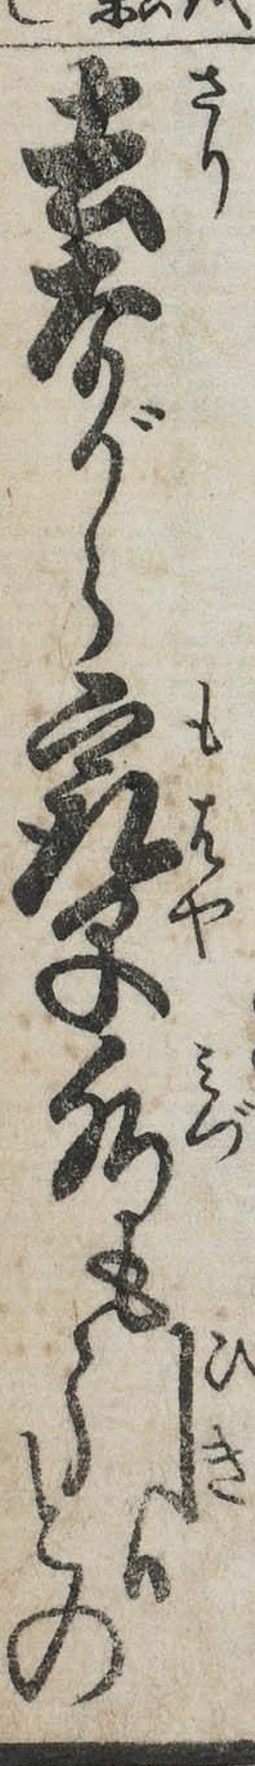去ながら最早水も引候との

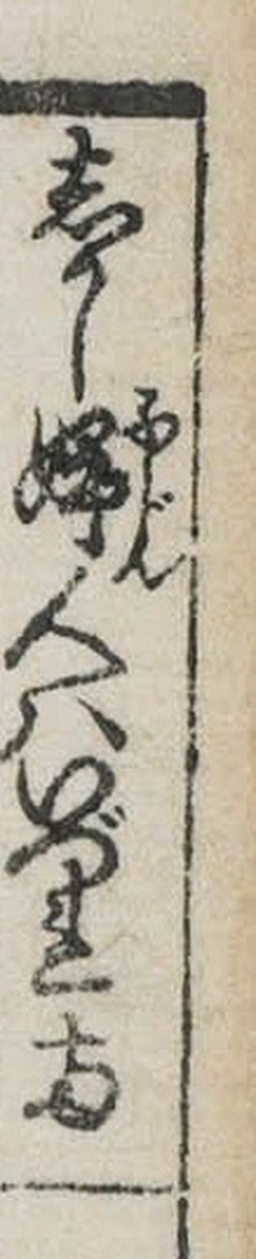しかし婦人はいづれも両
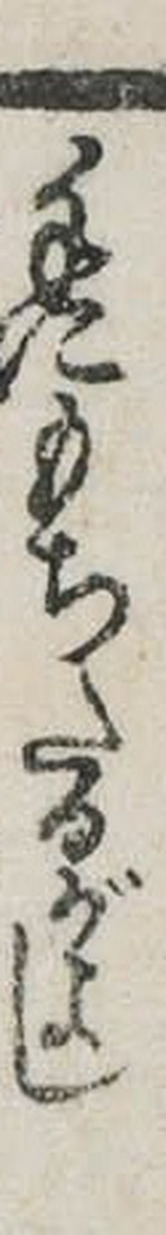手にもちたるがよし
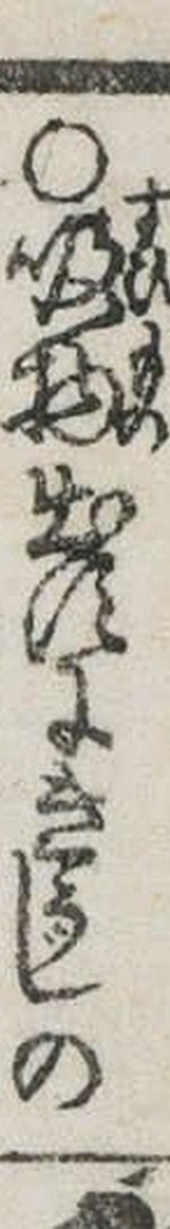○吸物出すにきうじの
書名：頭書萬用婦人手紙之文言
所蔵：東京学芸大学教育コンテンツアーカイブ
